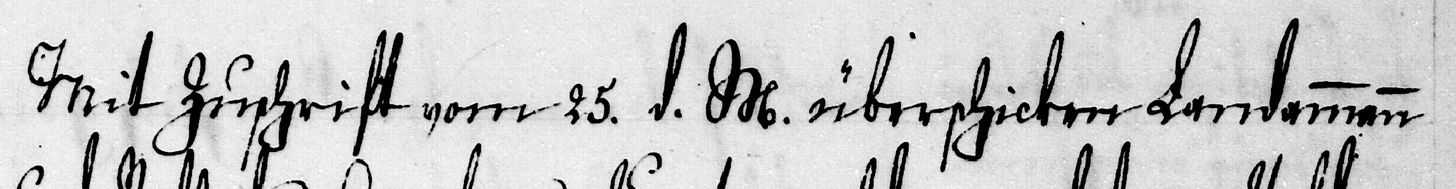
Mit Zuschrift vom 25. d. M. überschicken Landammann
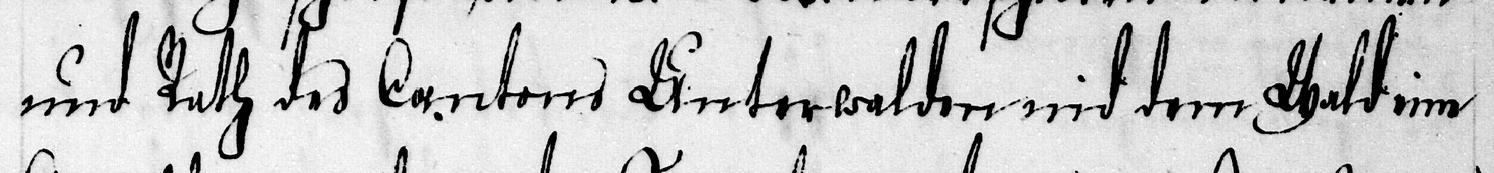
und Rath des Cantons Unterwalden nid dem Wald eine
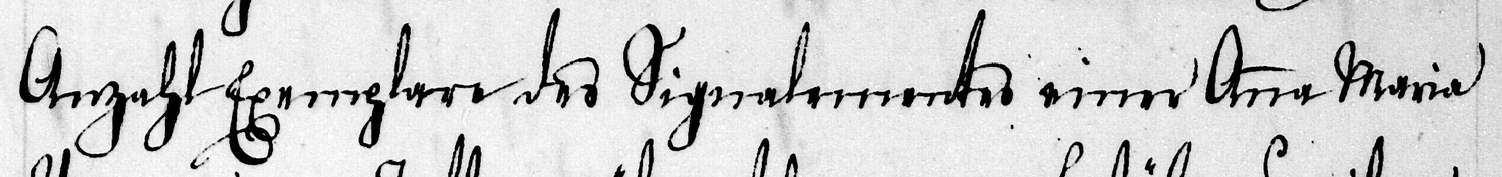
Anzahl Exemplare des Signalementes einer Anna Maria
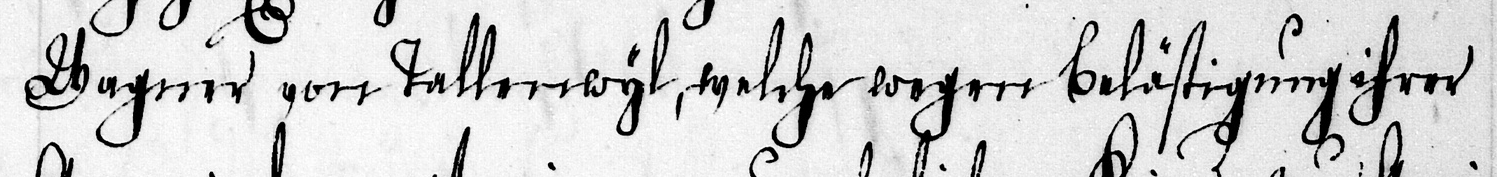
Wagner von Tallenwyl, welche wegen Belästigung ihrer
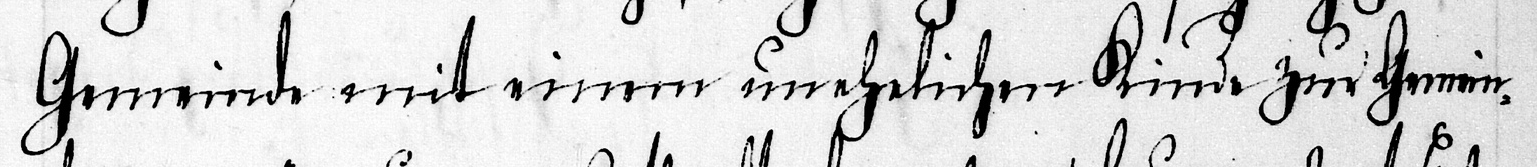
Gemeinde mit einem unehelichen Kinde zur Gemein¬
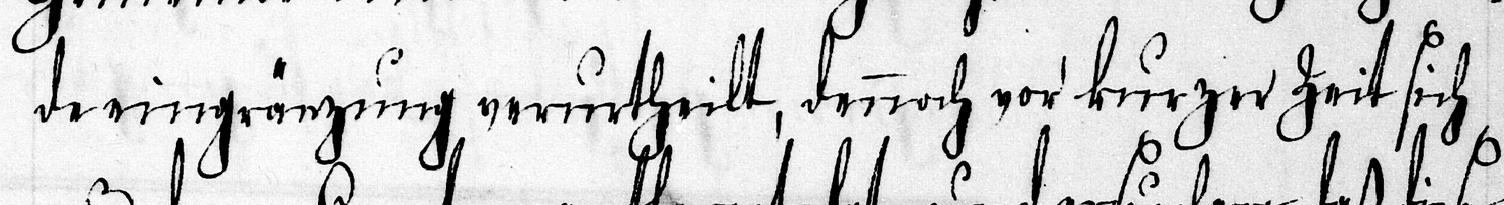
deeingränzung verurtheilt, dennoch vor kurzer Zeit sich
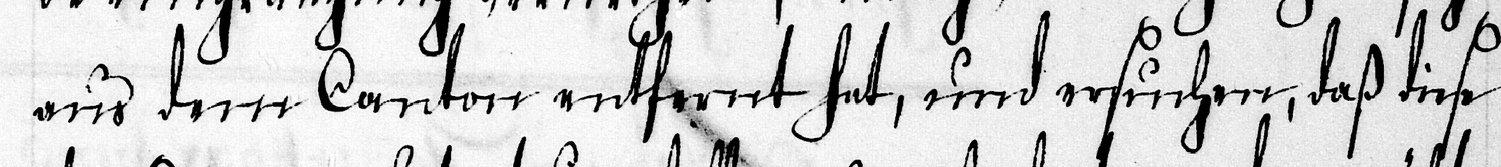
aus dem Canton entfernt hat, und ersuchen, daß diese
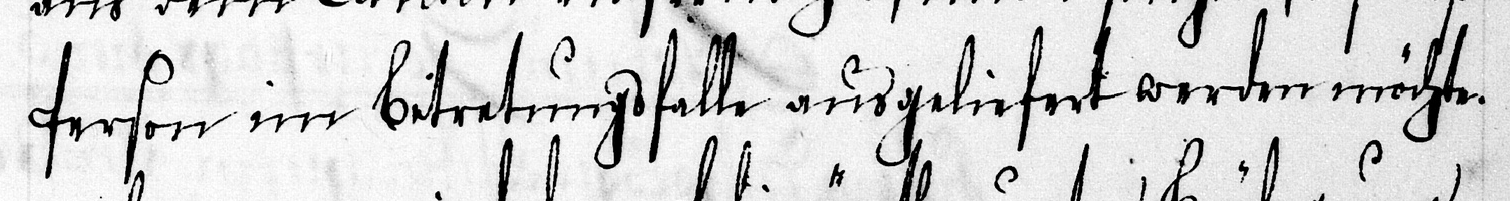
Person im Betretungsfalle ausgeliefert werden möchte.
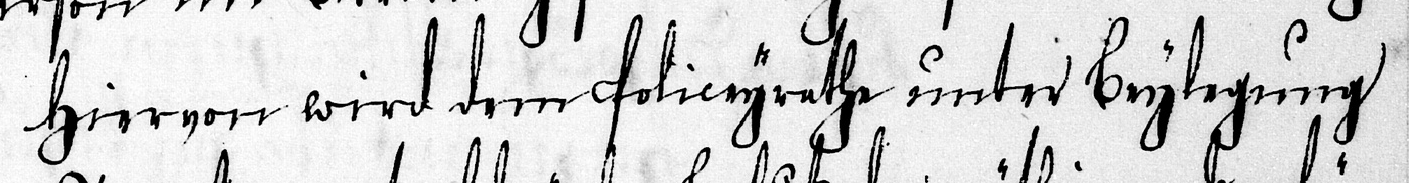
Hiervon wird dem Policeyrathe unter Beylegung
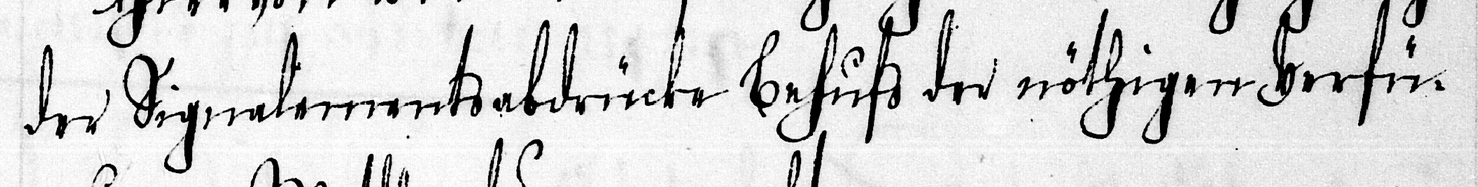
der Signalementsabdrücke Behufs der nöthigen Verfü¬
